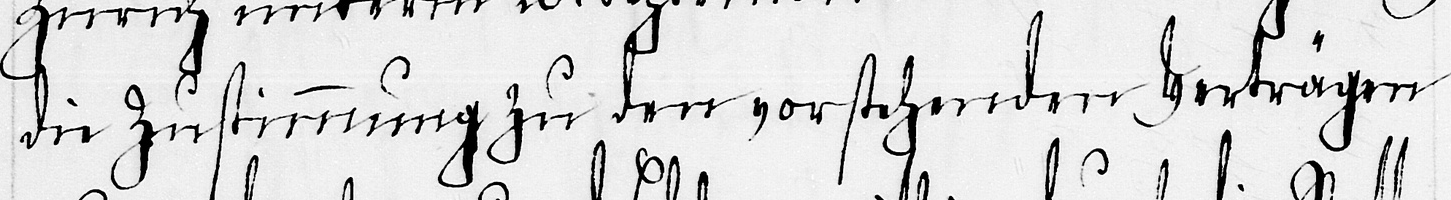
die Zustimmung zu den vorstehenden Verträgen
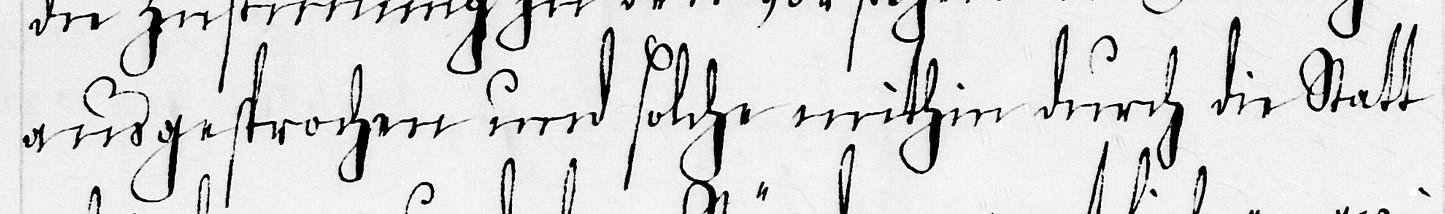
ausgesprochen und solche mithin durch die Statt
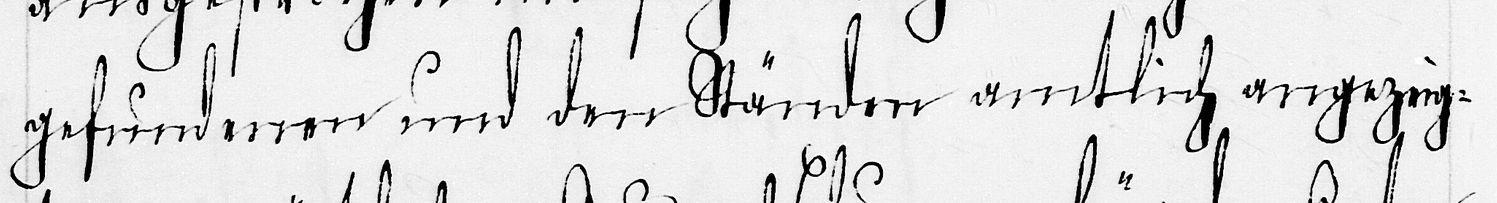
gefundenen und den Ständen amtlich angezeig¬
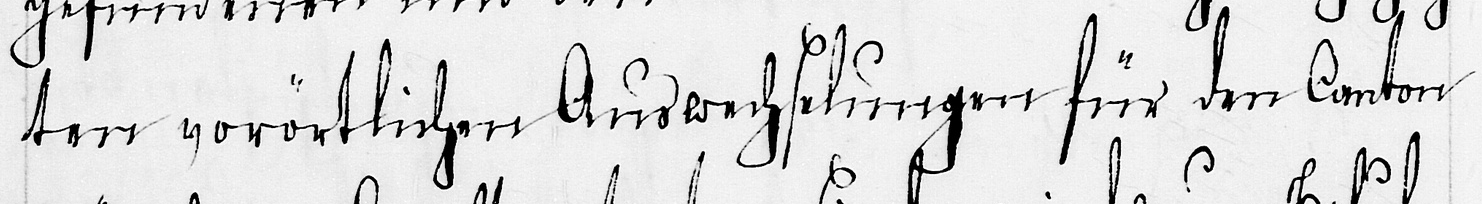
ten vorörtlichen Auswechselungen für den Canton
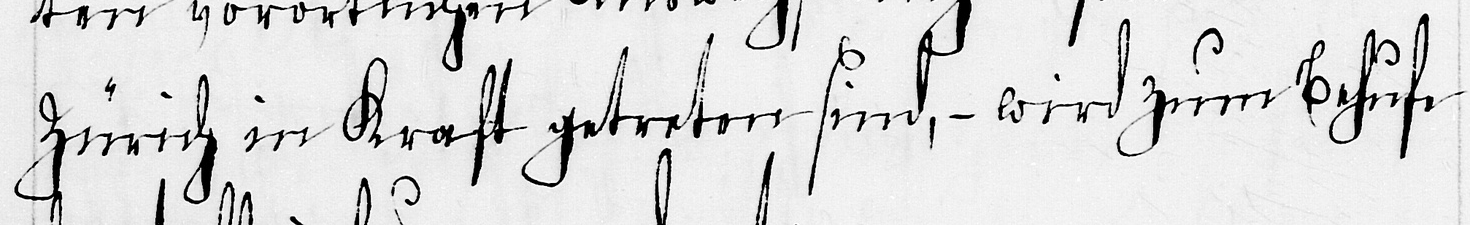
Zürich in Kraft getreten sind, − wird zum Behufe
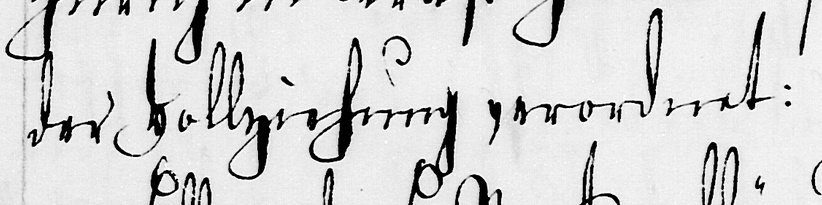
der Vollziehung verordnet:
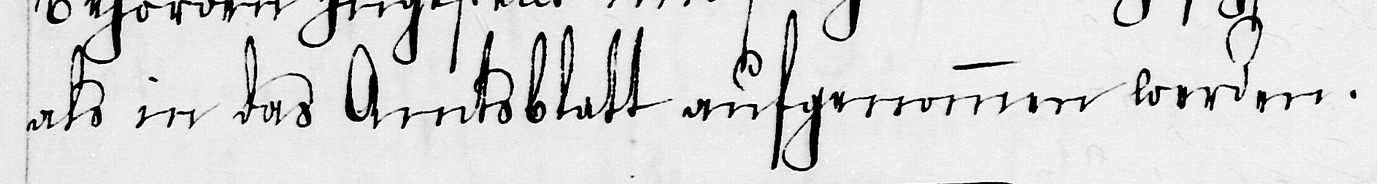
als in das Amtsblatt aufgenommen werden.
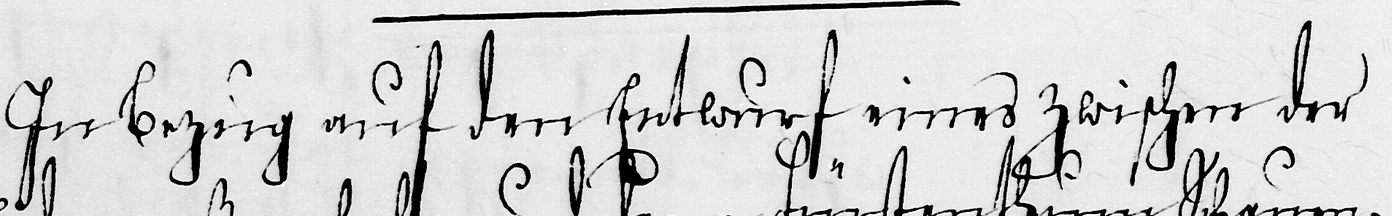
In Bezug auf den Entwurf eines zwischen der
